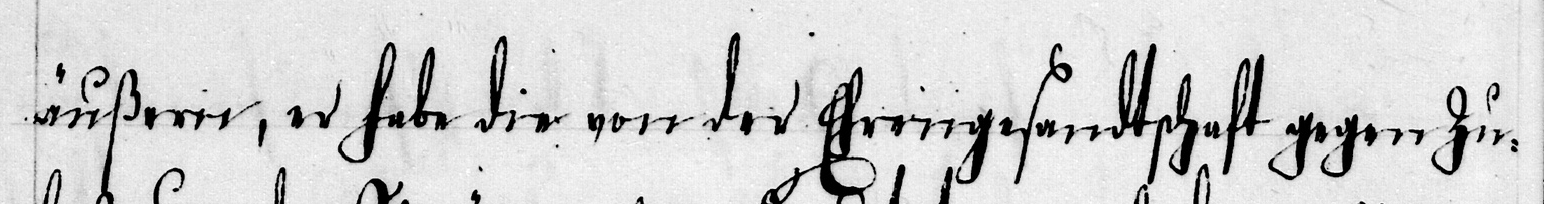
äußern, er habe die von der Ehrengesandtschaft gegen Zu¬
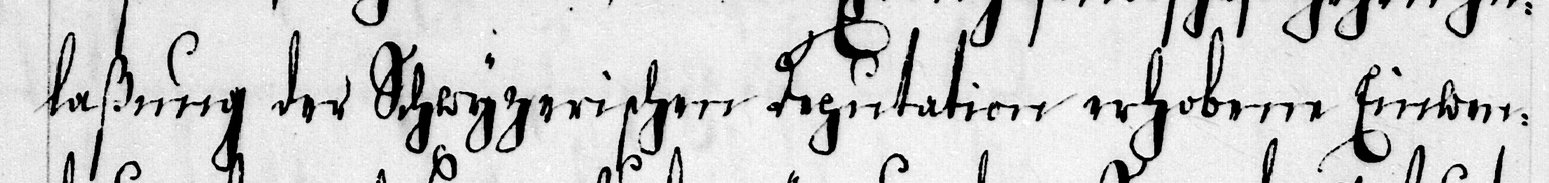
laßung der Schwyzerischen Deputation erhobene Einwen¬
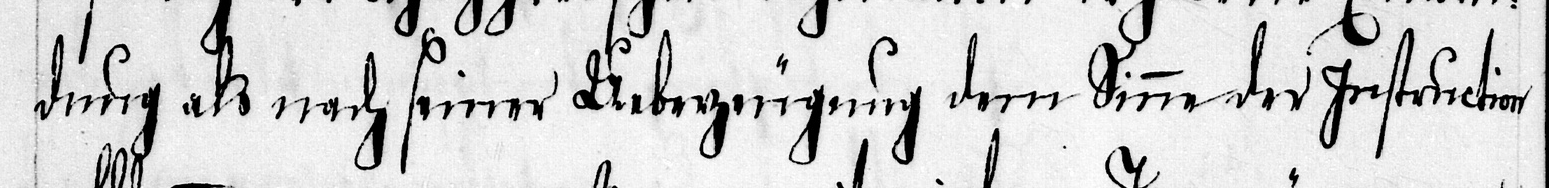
dung als nach seiner Ueberzeugung dem Sinne der Instruction
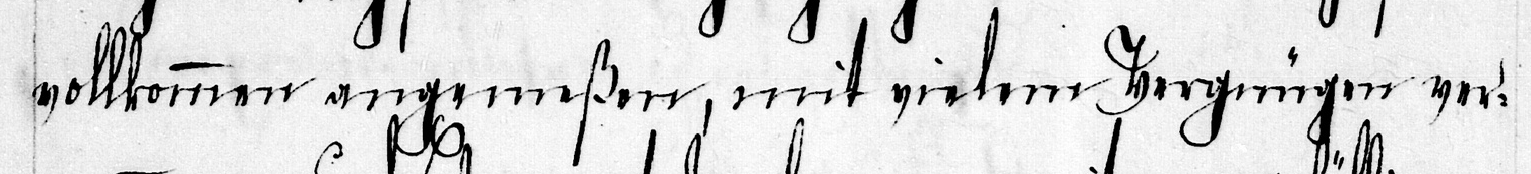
vollkommen angemeßen, mit vielem Vergnügen ver¬
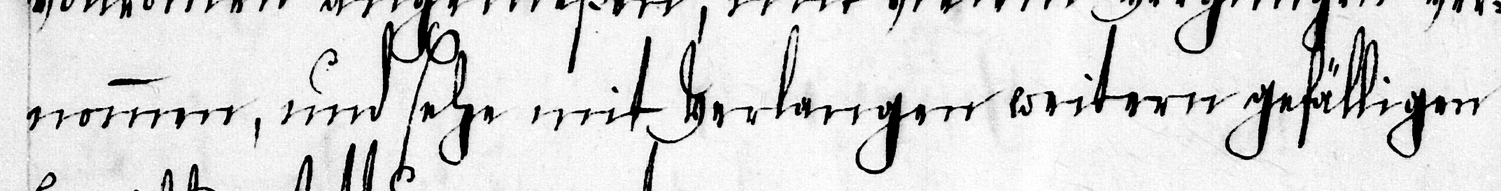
nommen, und sehe mit Verlangen weitern gefälligen
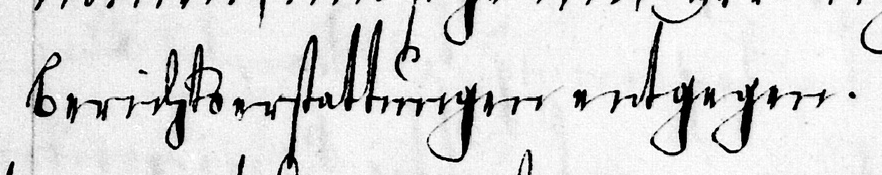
Berichtserstattungen entgegen.
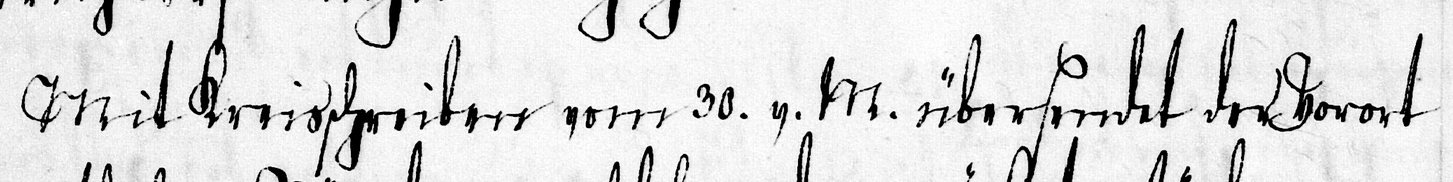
Mit Kreisschreiben vom 30. v. M. übersendet der Vorort
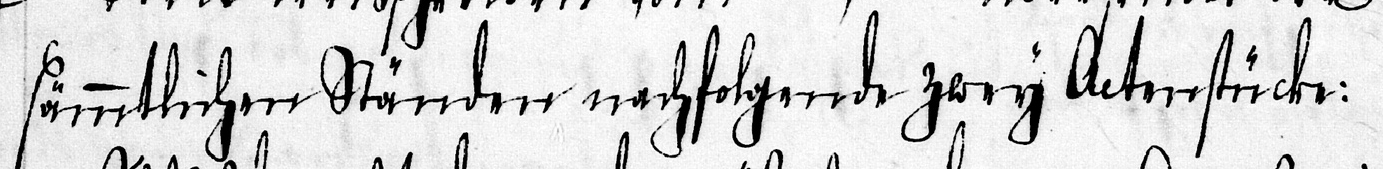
sämmtlichen Ständen nachfolgende zwey Actenstücke:
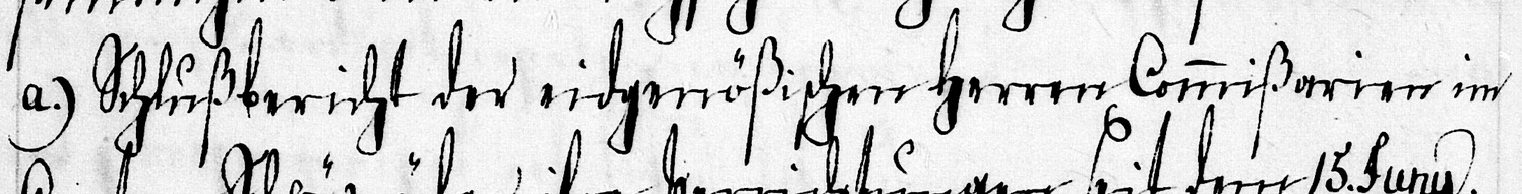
a.) Schlußbericht der eidgenößischen Commißarien im
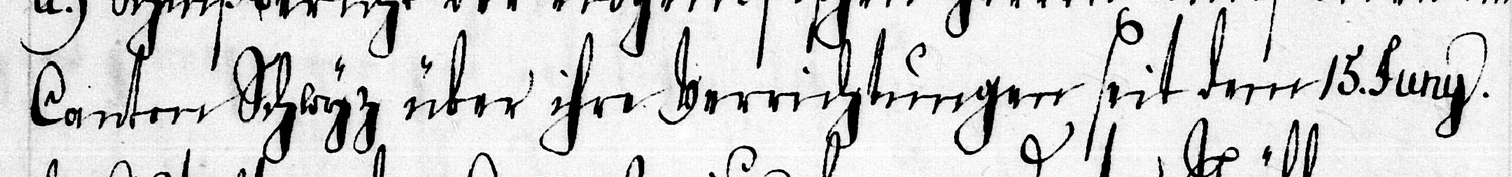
Canton Schwyz über ihre Verrichtungen seit dem 15. Juny.
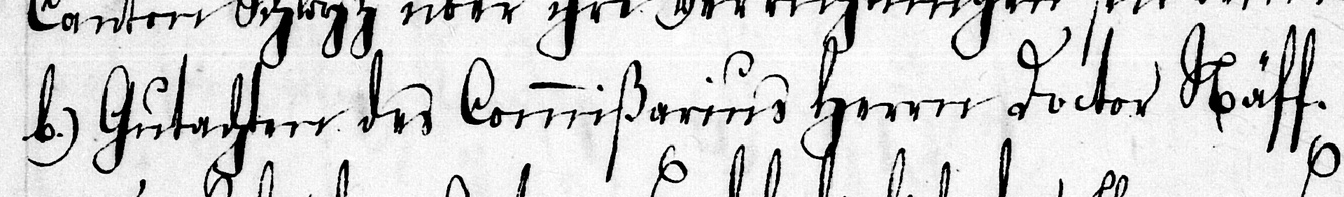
b.) Gutachten des Commißarius Herrn Doctor Näff.
